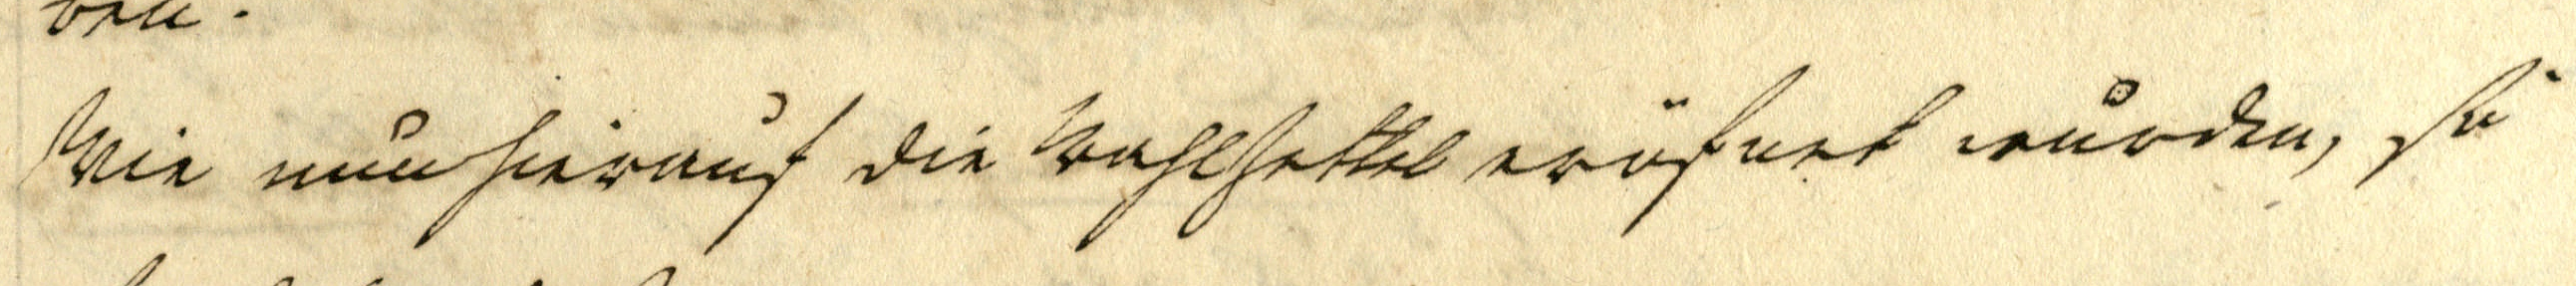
Wie nunhierauf die Wahlzettel eröfnet wurden, so
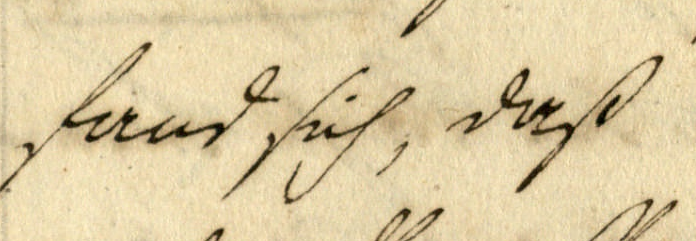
fand sich, daß
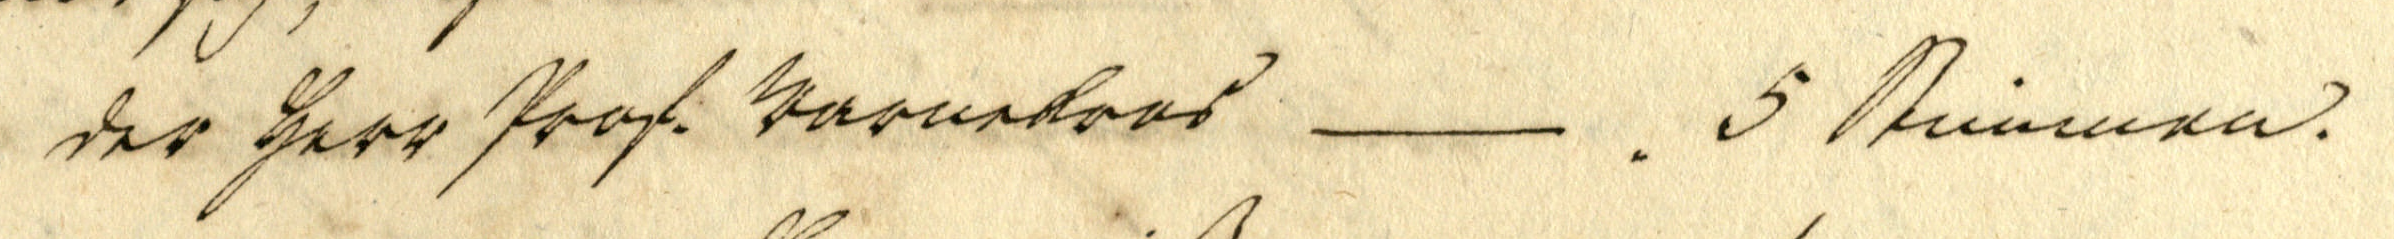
der Herr Prof. Warnekros 5 Stimmen.
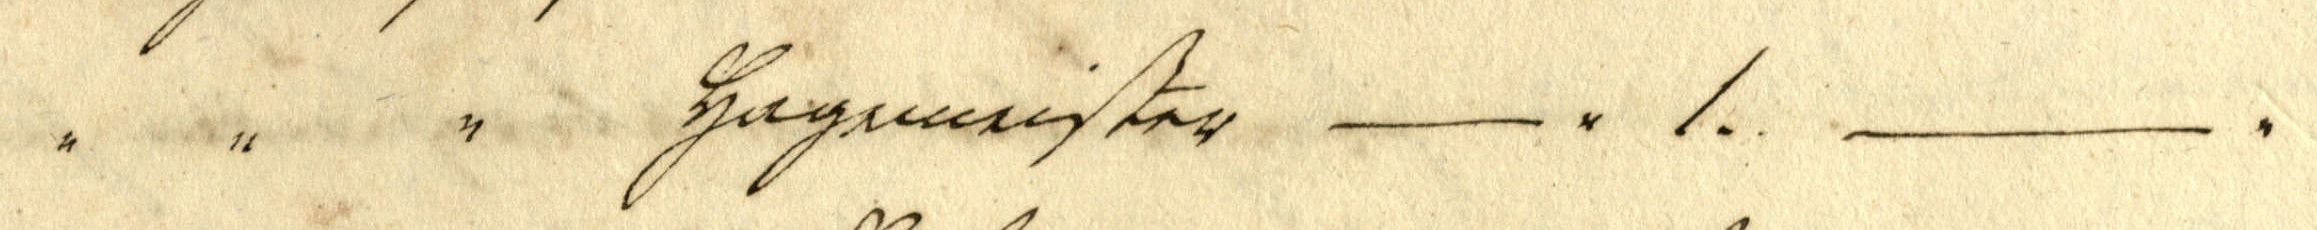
Hagemeister 1.
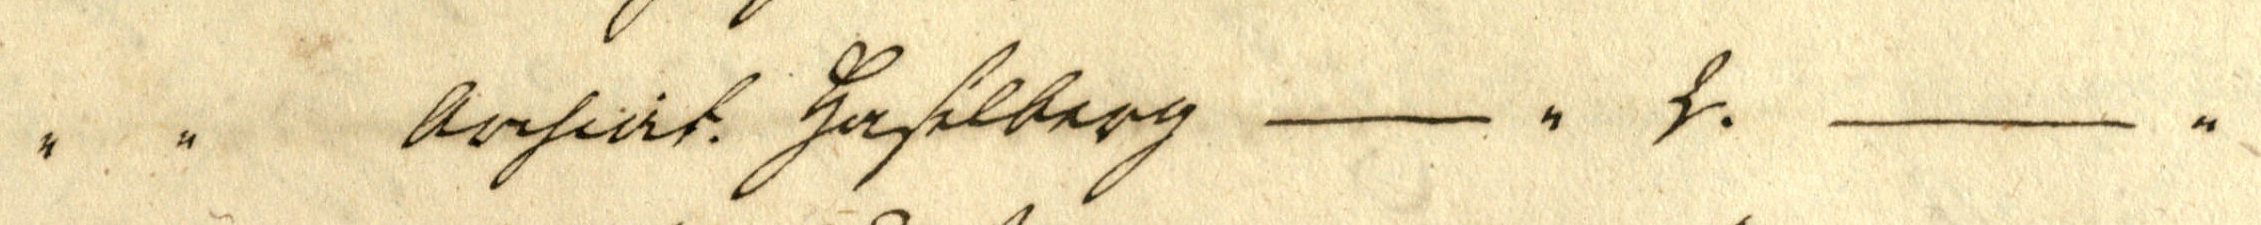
Archiat. Haselberg 2.
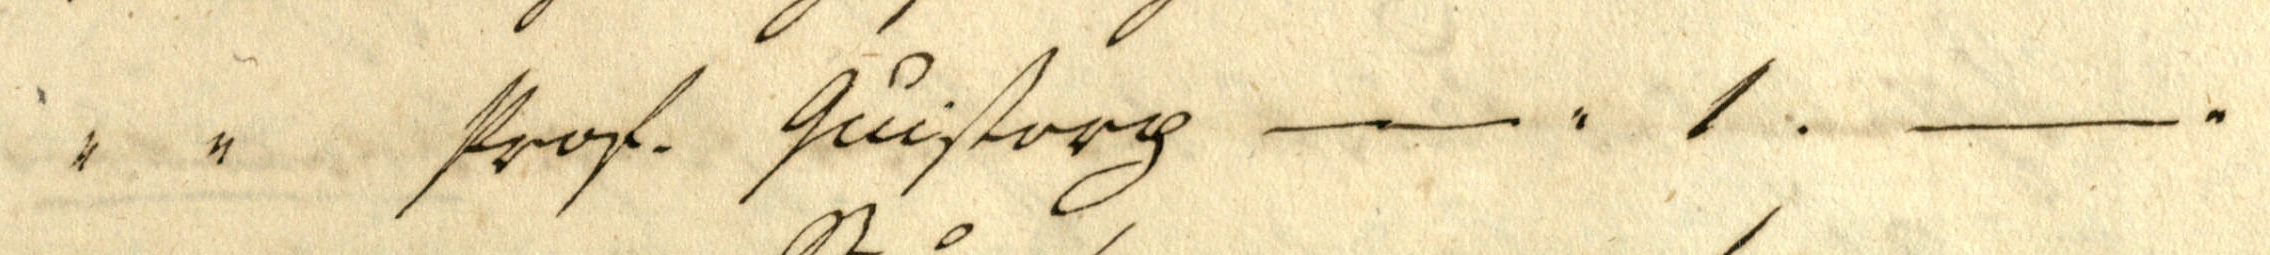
Prof. Quistorp 1.
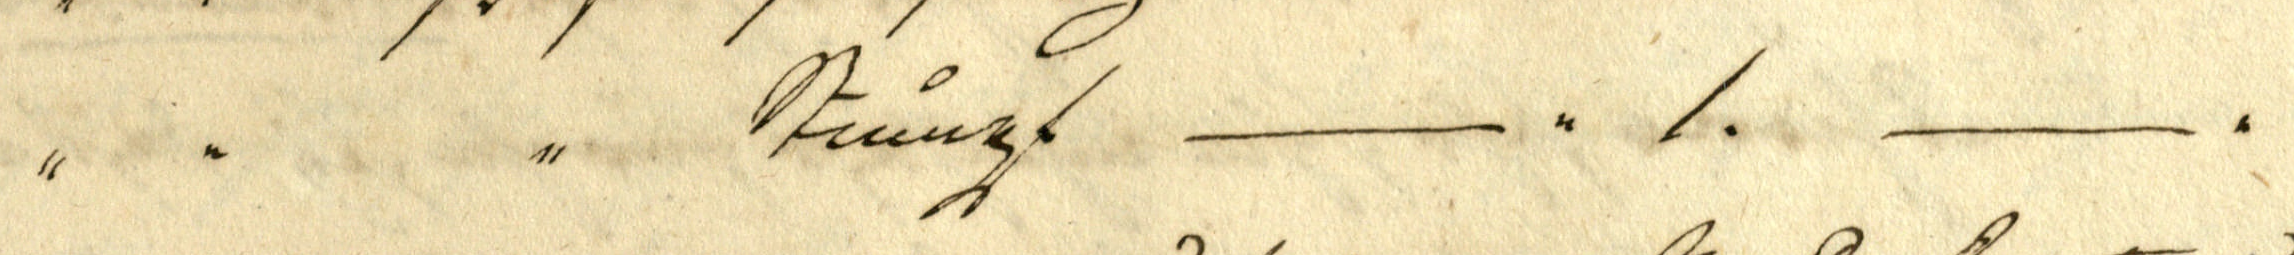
Stumpf 1.
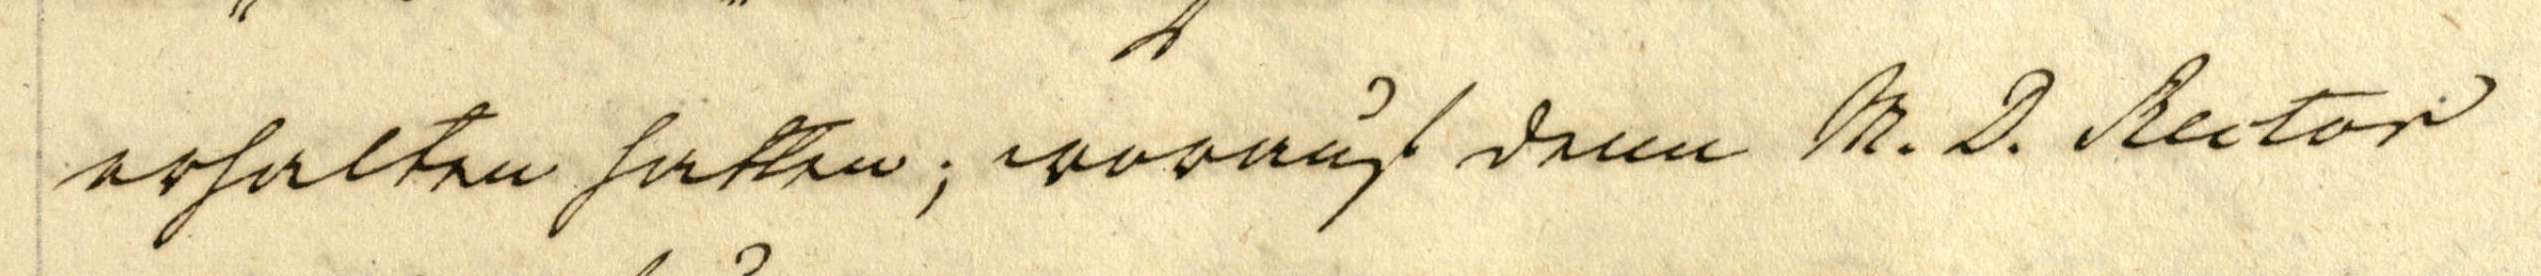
erhalten hatten; worauf denn M. D. Rector
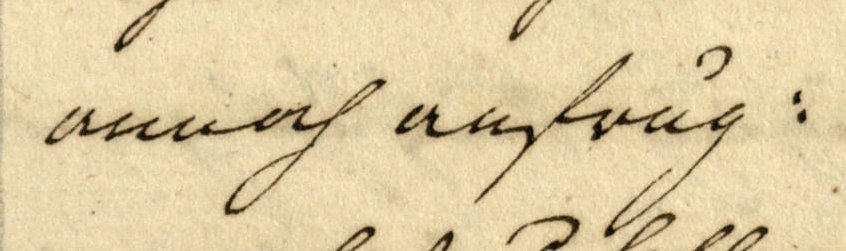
annoch anfrug:
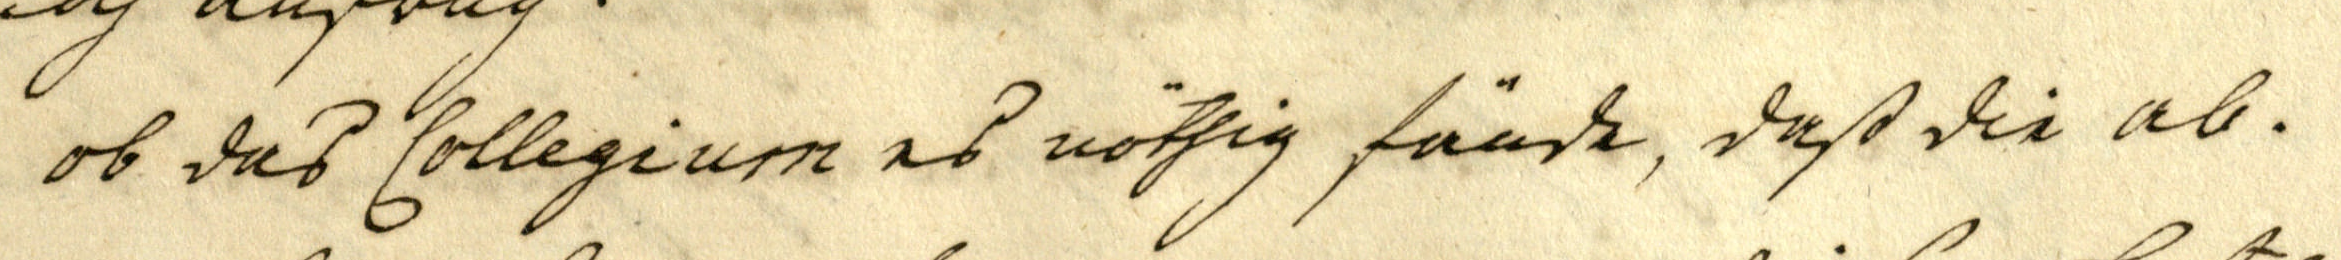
ob das Collegium es nöthig fände, daß die ab¬
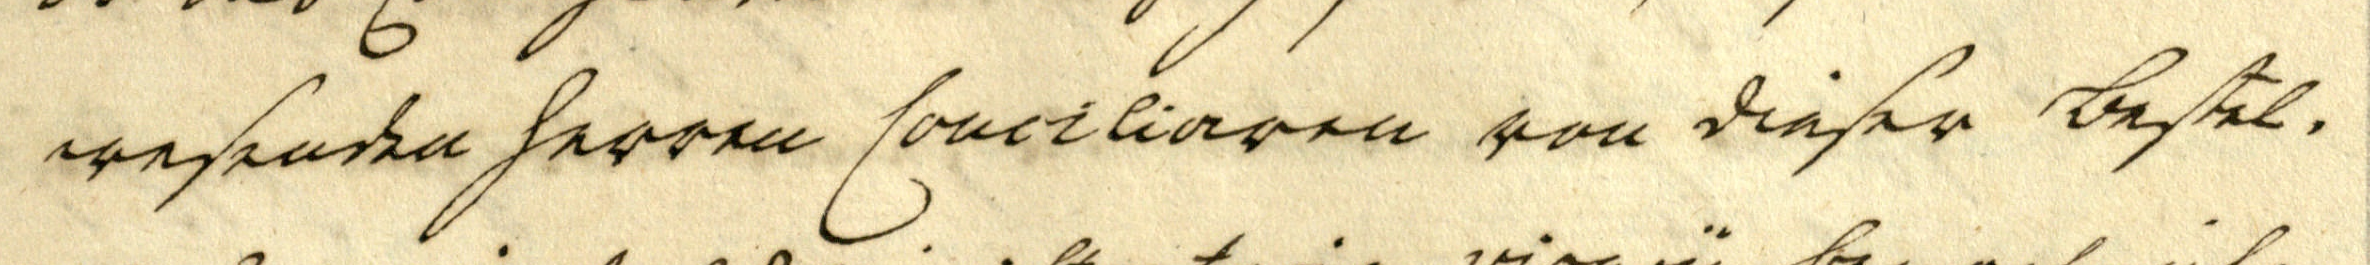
wesenden Herren Conciliaren von dieser Bestel¬
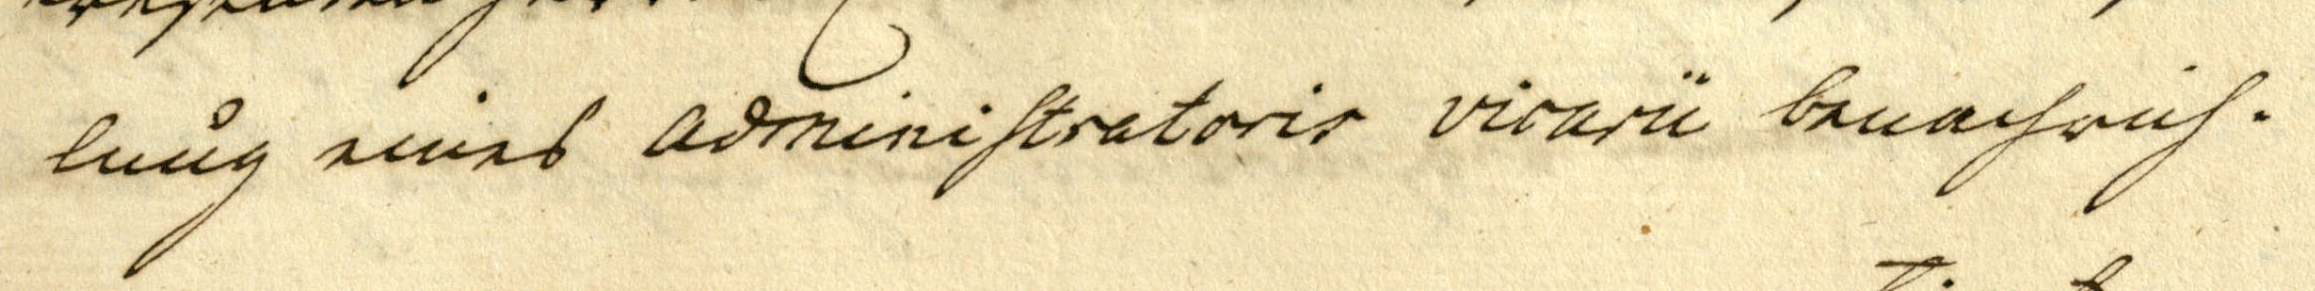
lung eines Administratoris vicarii benachrich-
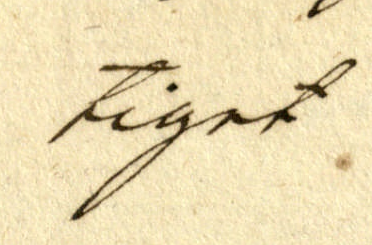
tiget
